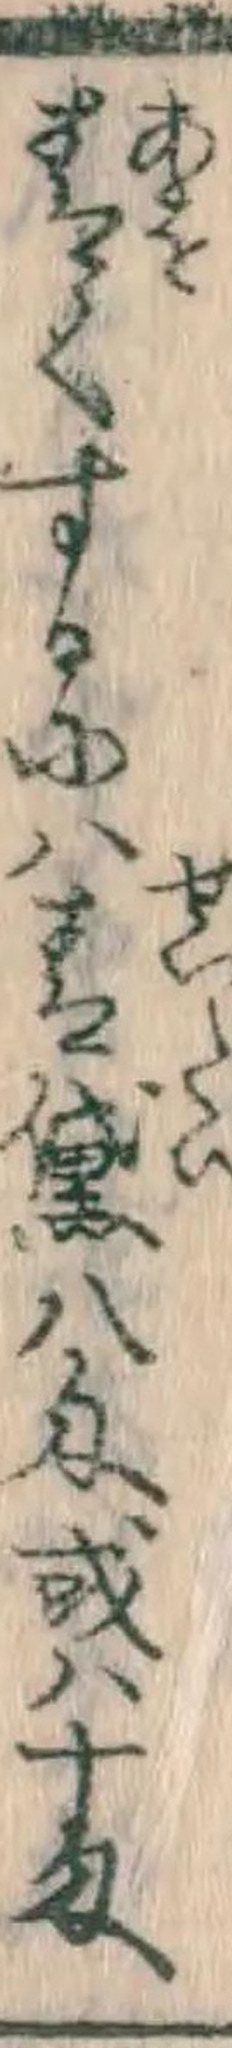青くするには青黛八匁或は十匁
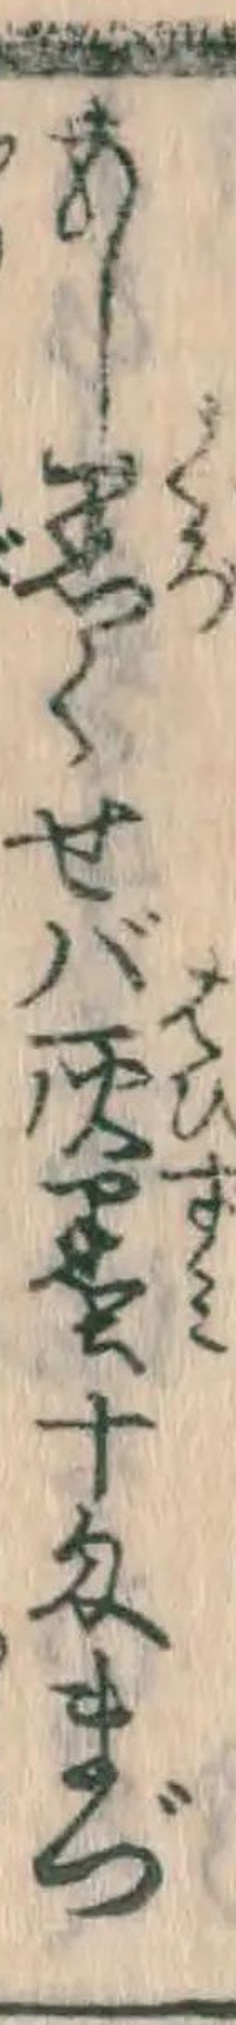もし黒くせば灰墨十匁まづ
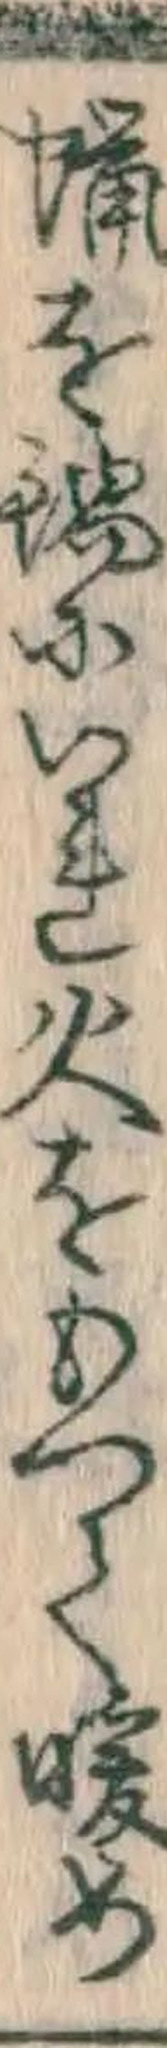蝋を鍋にいれ火をもつて暖め
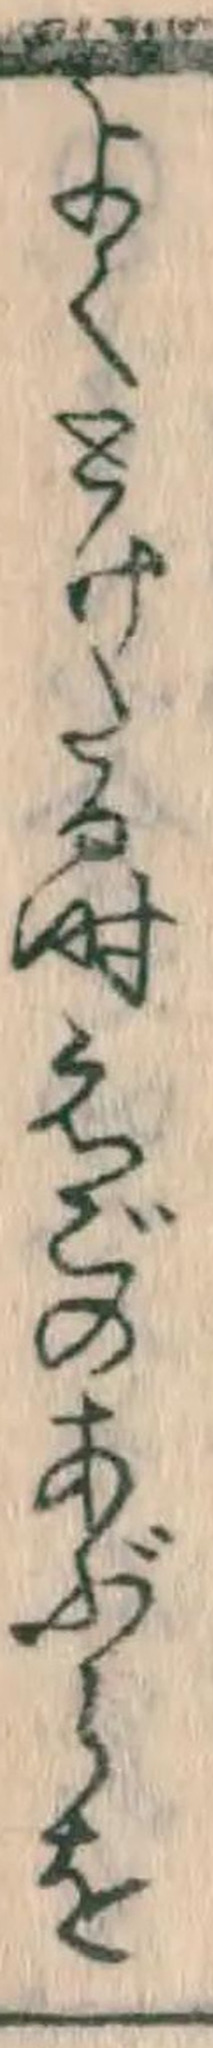よくとけたる時えごのあぶらを
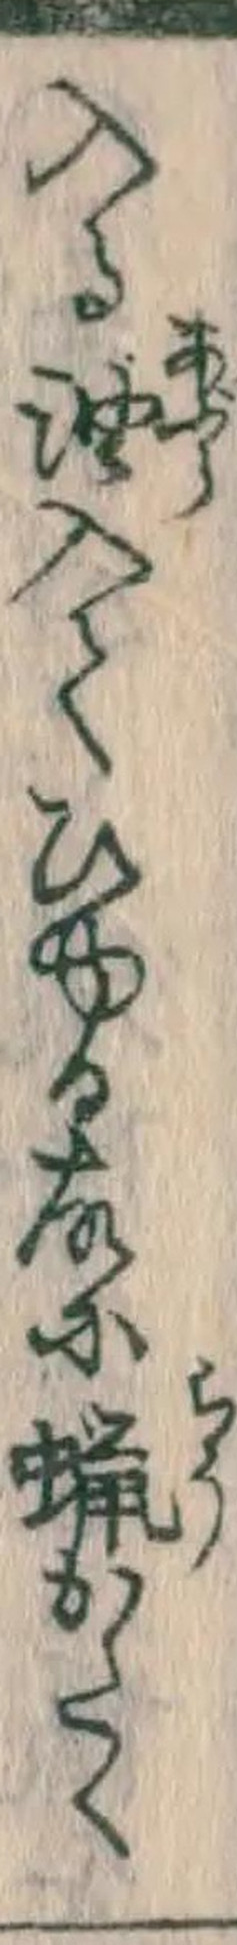入る油入てひゆる故に蝋かたく
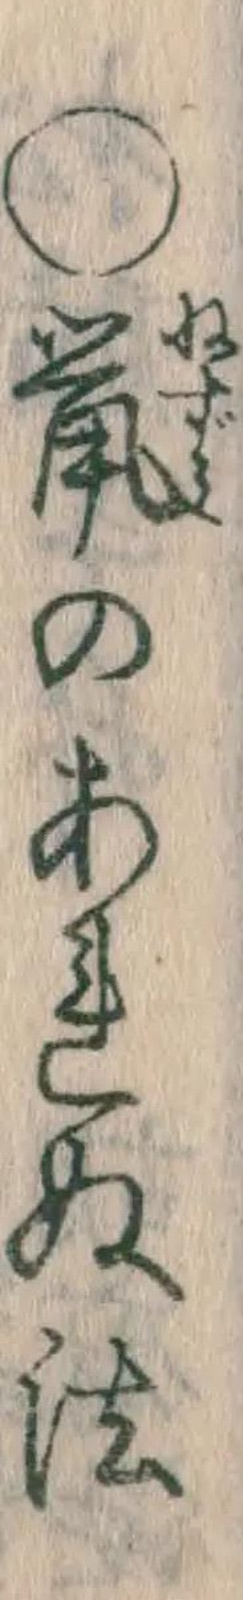○鼠のあれぬ法
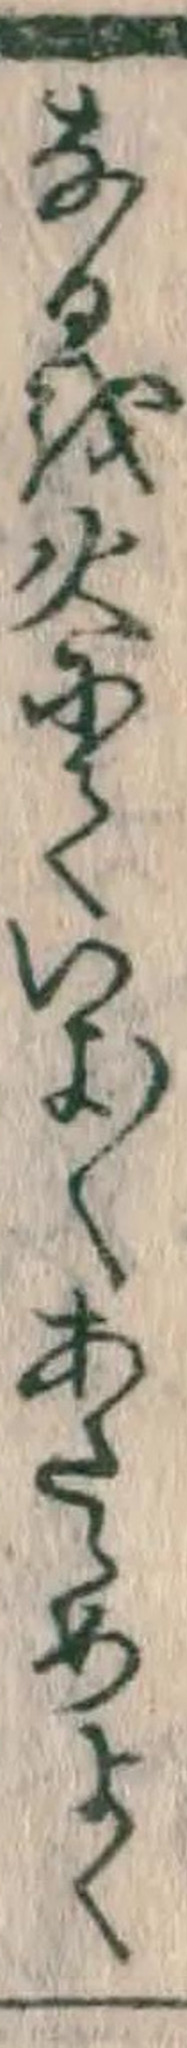なるを火にていよ〳〵あたゝめよく
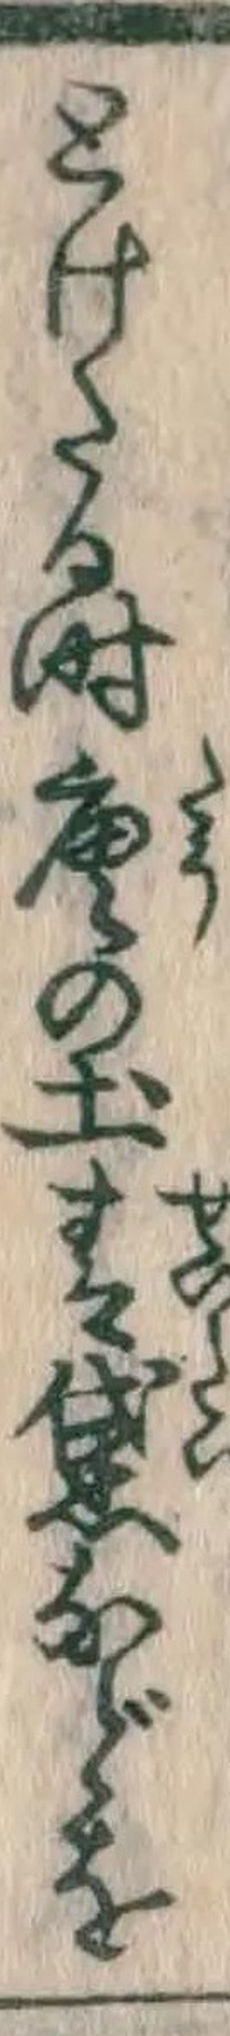とけたる時唐の土青黛などを
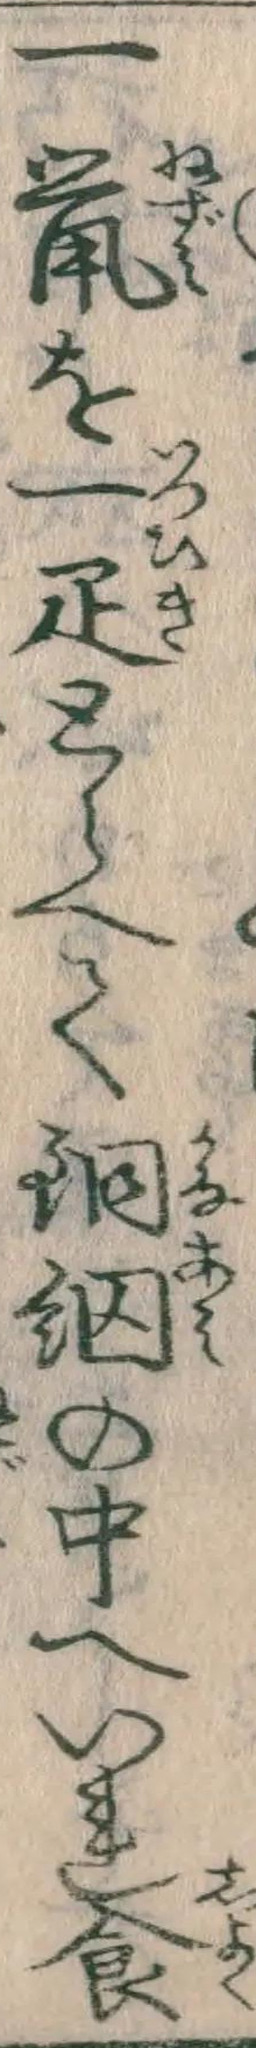一鼠を一疋とらへて銅網の中へいれ食
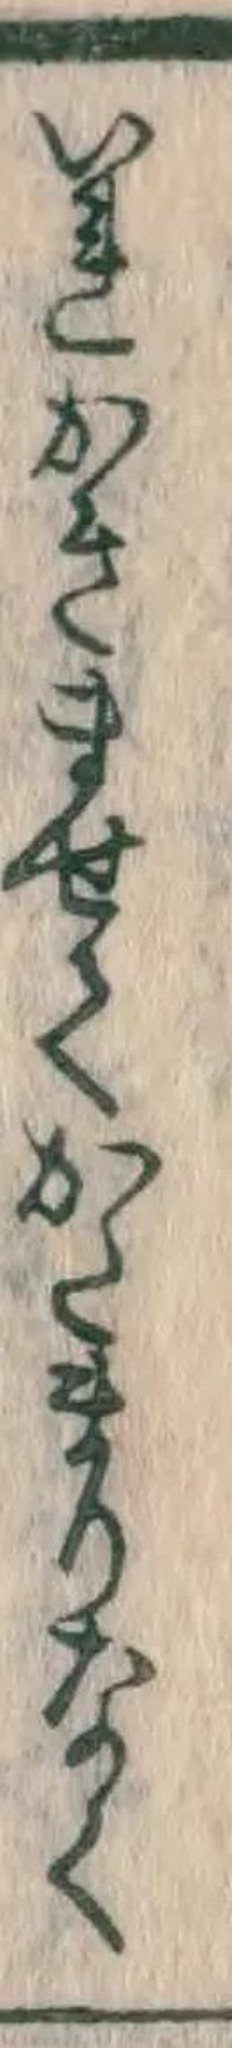いれかきませてかたまりなく
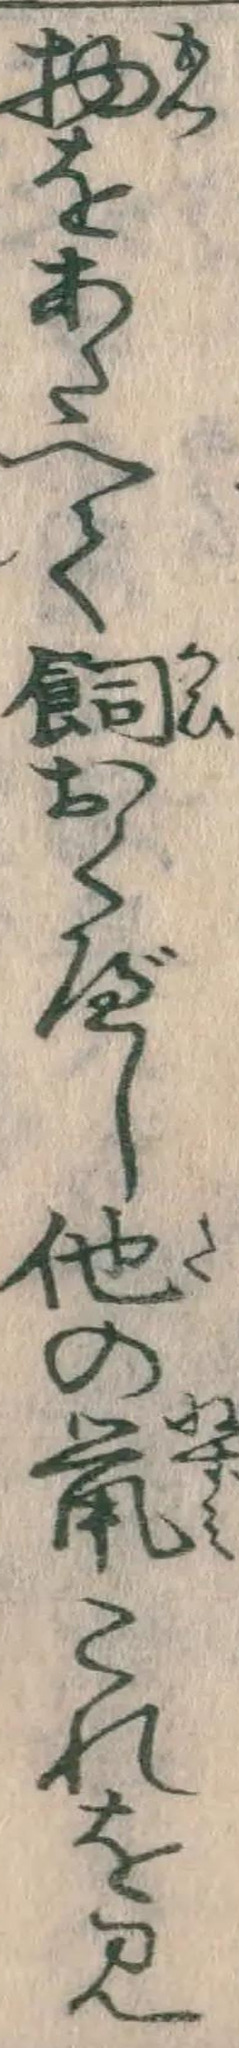物をあたへて飼おくべし他の鼠これを見
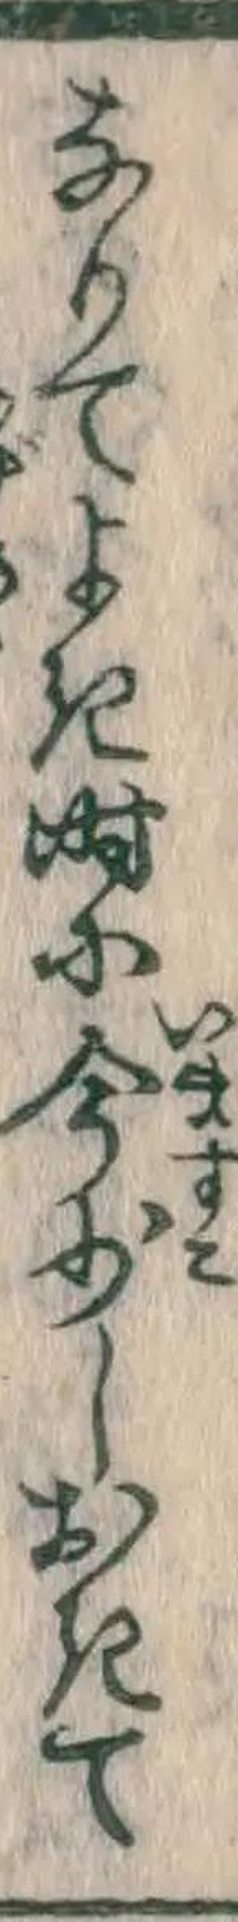なりてよき時に今少しおきて
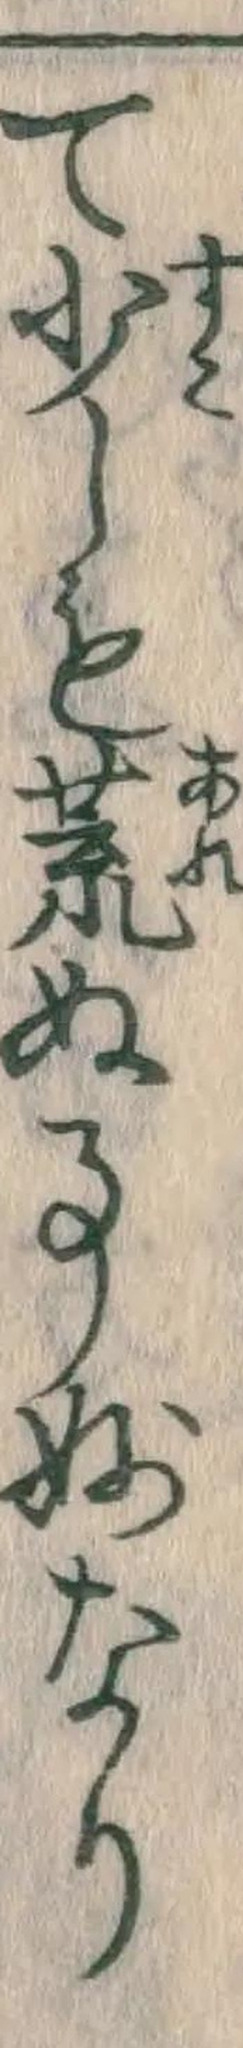て少しも荒ぬ事妙なり
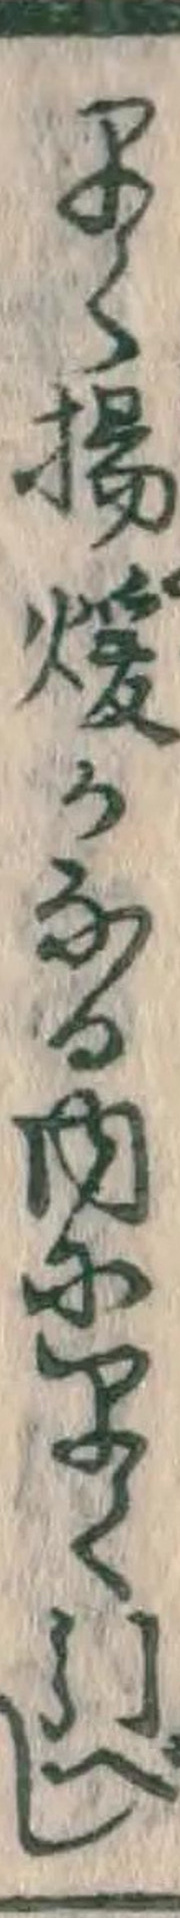早く揚煖かなる内に早く引べし
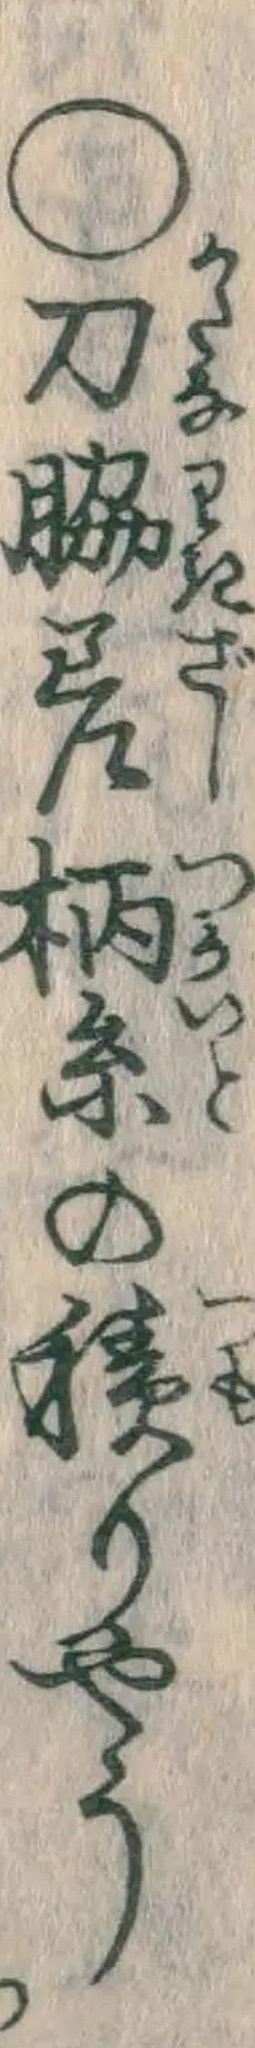○刀脇差柄糸の積りやう
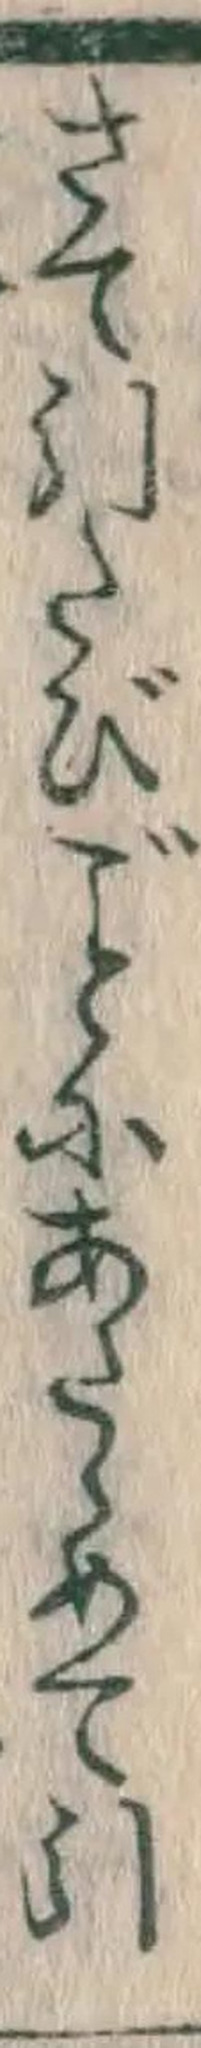さて引たびごとにあたゝめて引
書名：広益秘事大全 3巻. [2]
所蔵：国立国会図書館 National Diet Library, JAPAN
